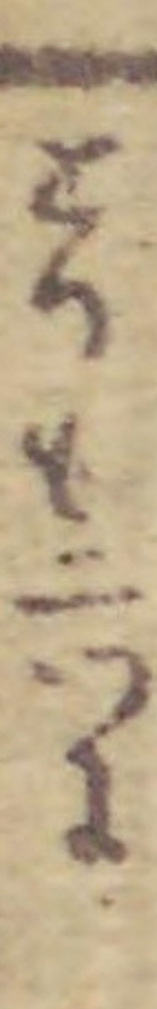とりも二つに
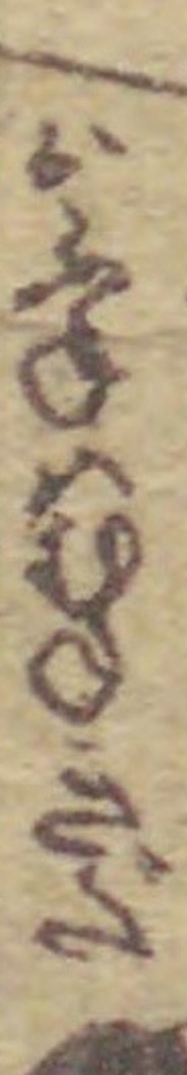おふねはむねきだ
